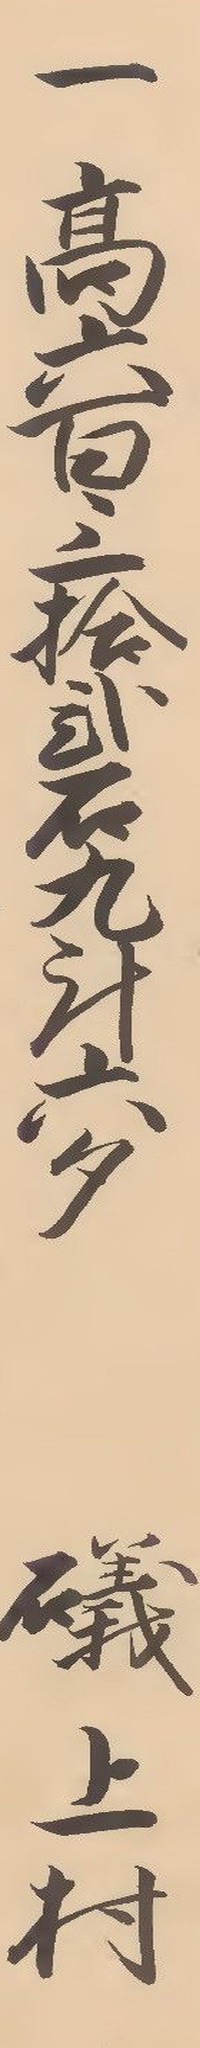一高六百三拾弐石九斗六勺磯上村
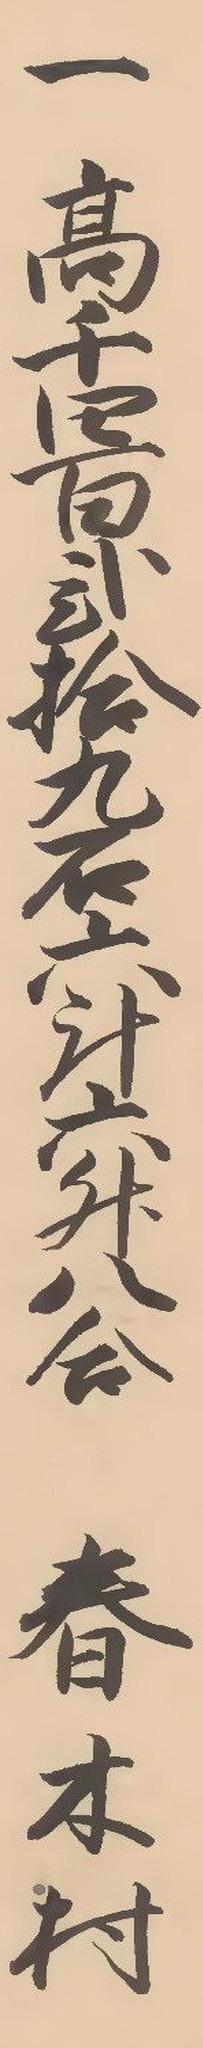一高千四百弐拾九石六斗六升八合春木村
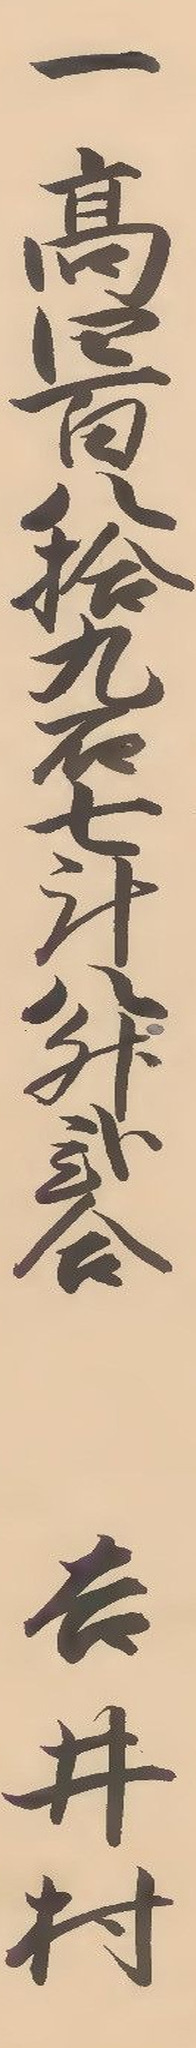一高四百八拾九石七斗八升弐合吉井村

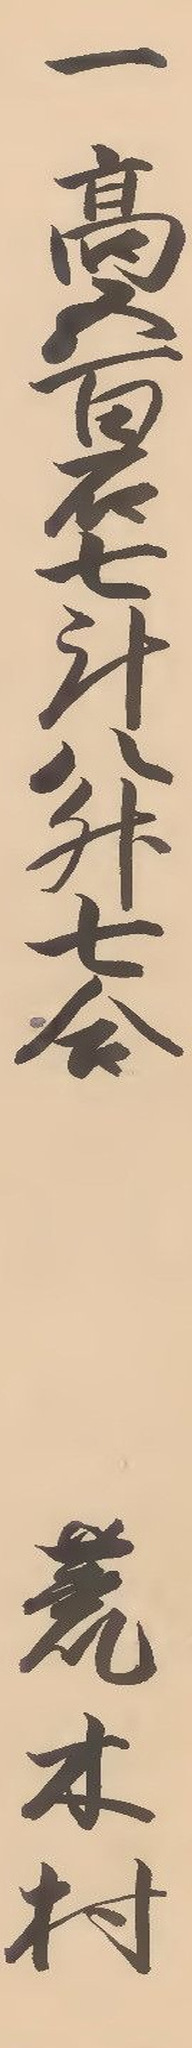一高五百石七斗八升七合荒木村
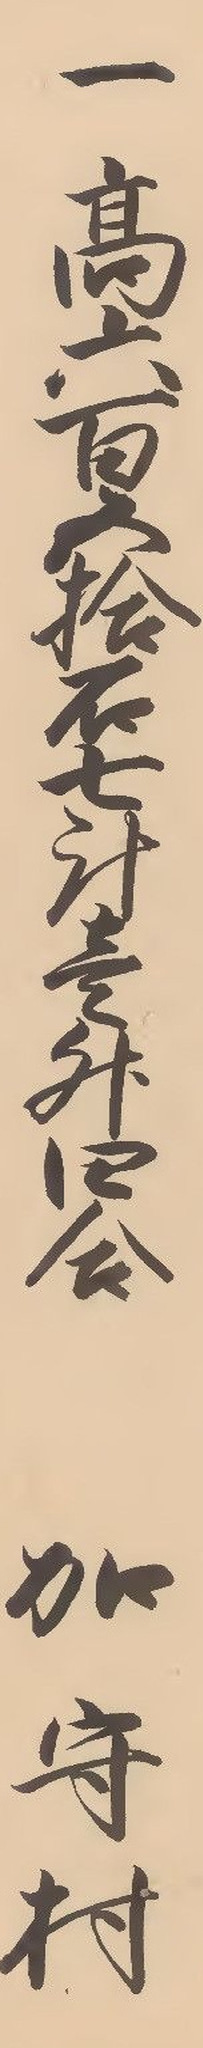一高六百五拾石七斗壱升四合加守村
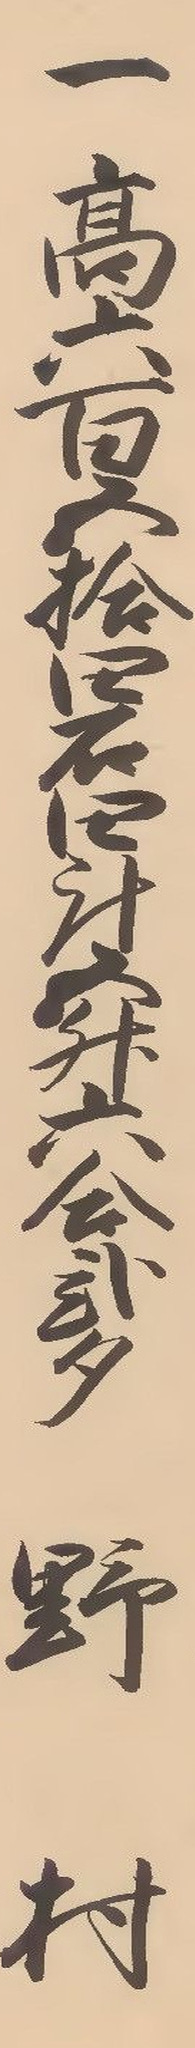一高六百五拾四石四斗五升六合弐勺野村
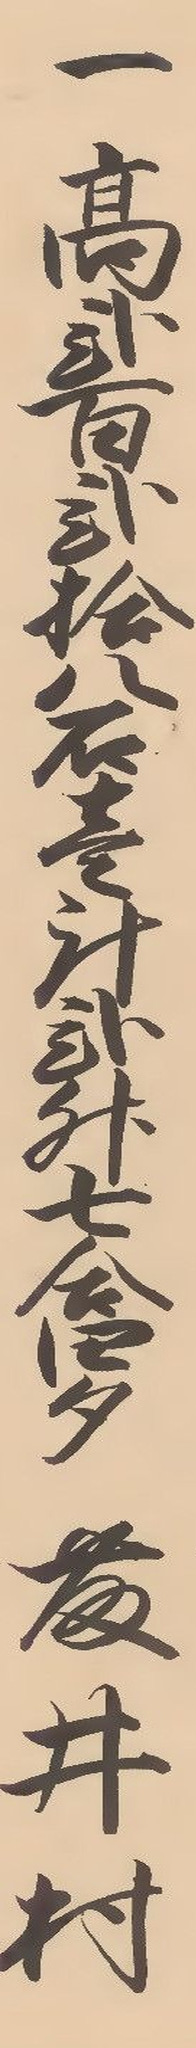一高弐百弐拾八石壱斗弐升七合四勺藤井村
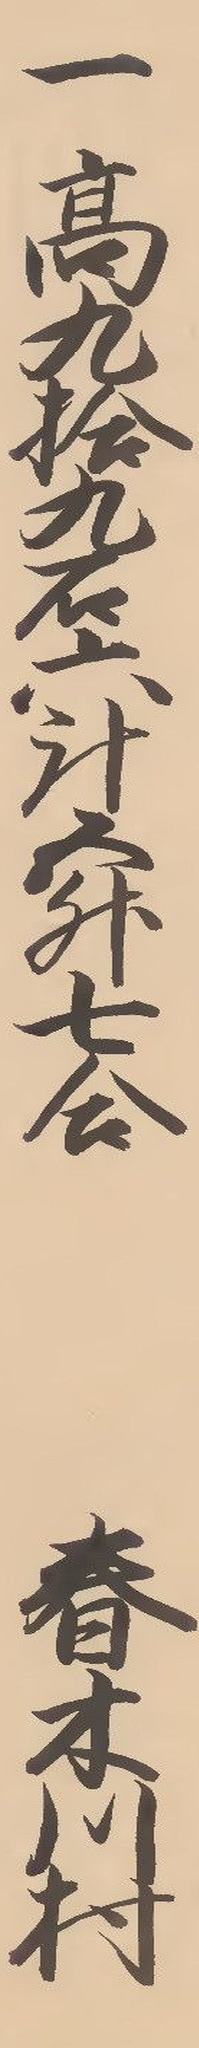一高九拾九石六斗五升七合春木川村
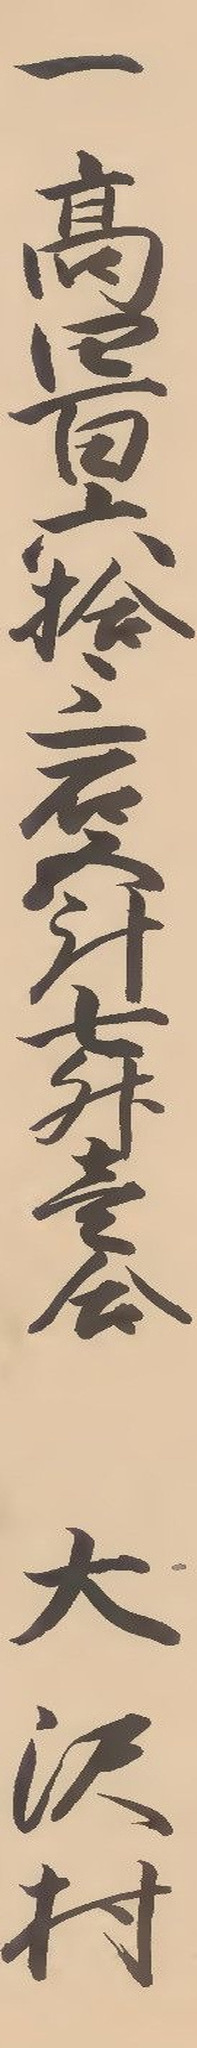一高四百六拾三石五斗七升壱合大沢村
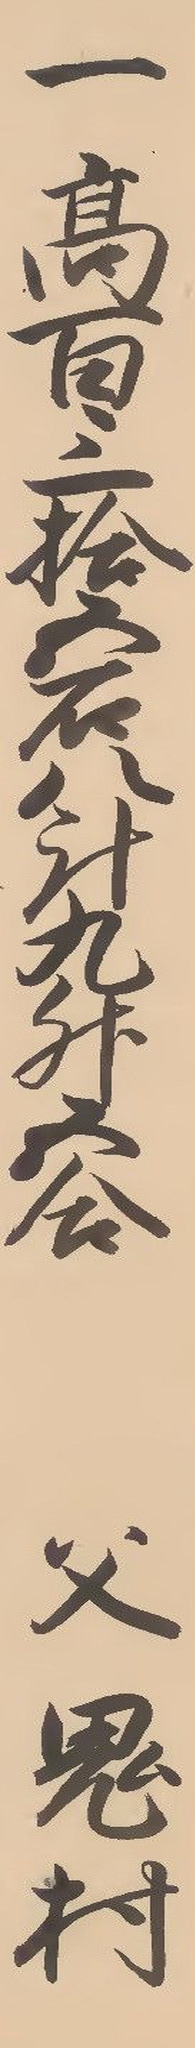一高百三拾五石八斗九升五合父鬼村
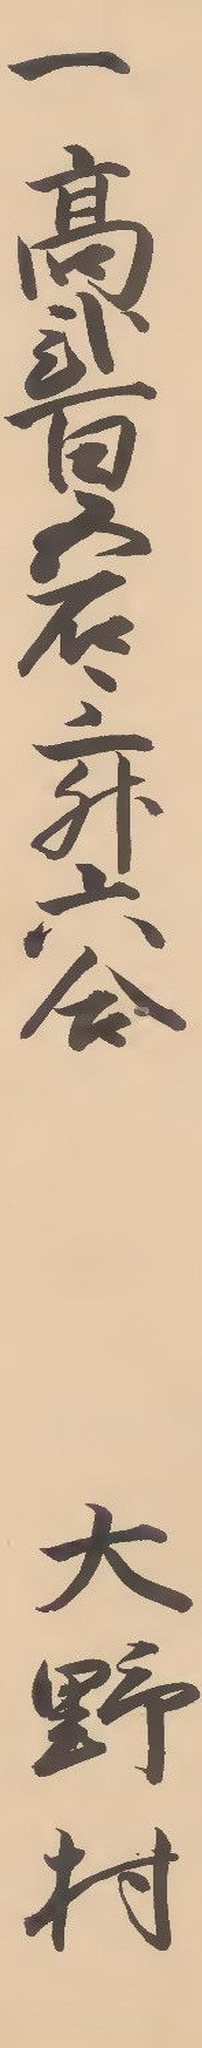一高弐百五石三升六合大野村

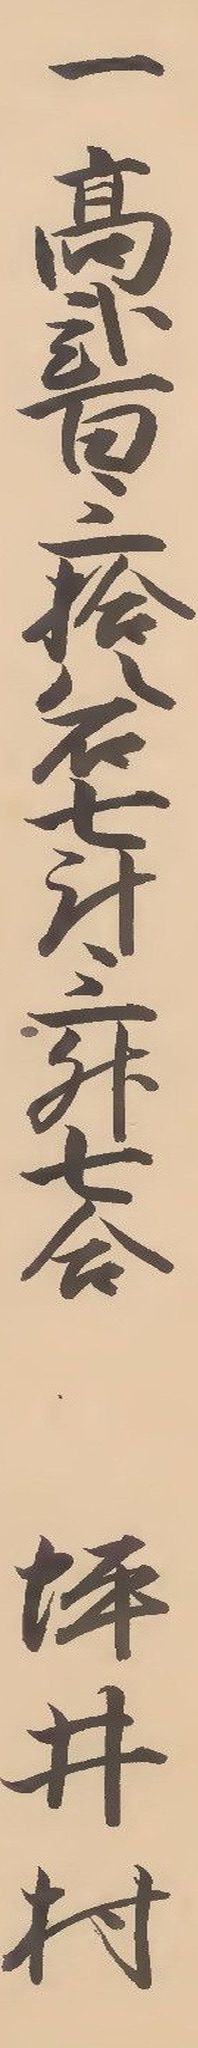一高弐百三拾八石七斗三升七合坪井村
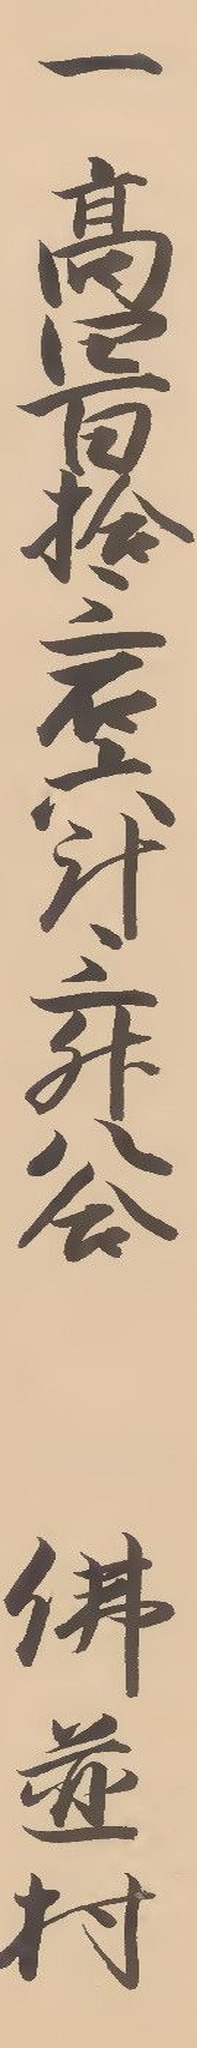一高四百拾三石六斗三升八合仏並村
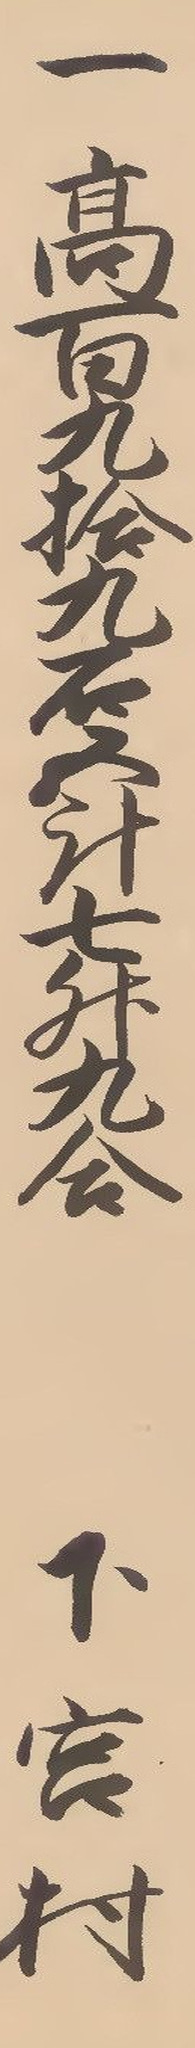一高百九拾九石五斗七升九合下宮村
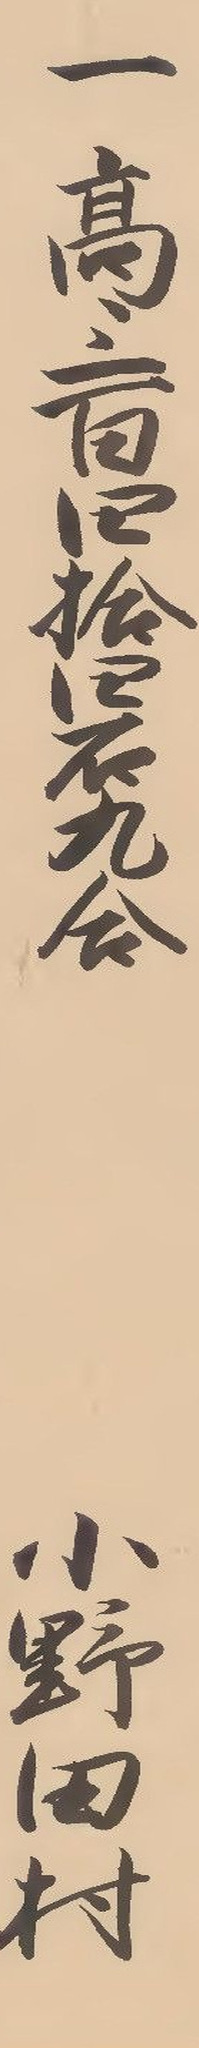一高三百四拾四石九合小野田村
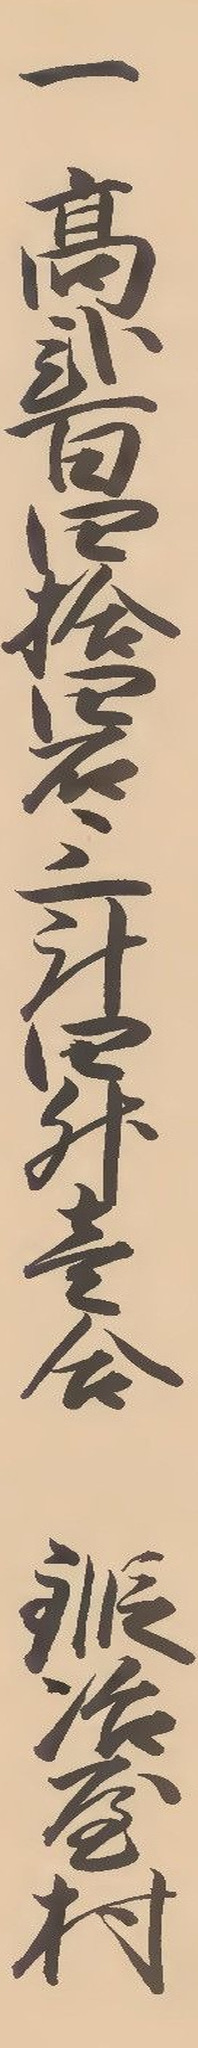一高弐百四拾四石三斗四升壱合鍛冶屋村
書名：和泉国郷帳
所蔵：国立公文書館 National Archives of Japan
